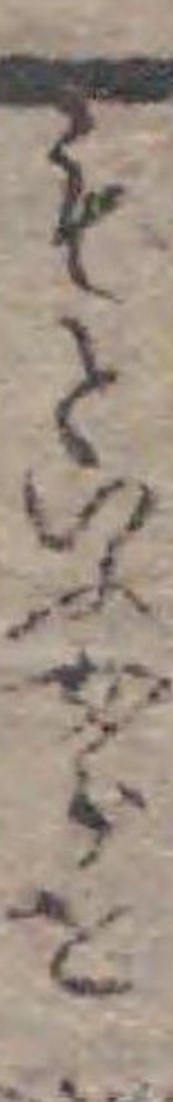もといふ女郎を
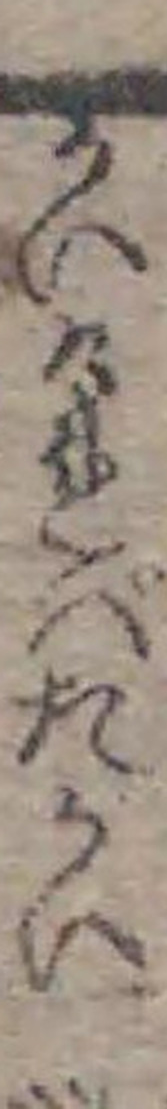かいければたかい
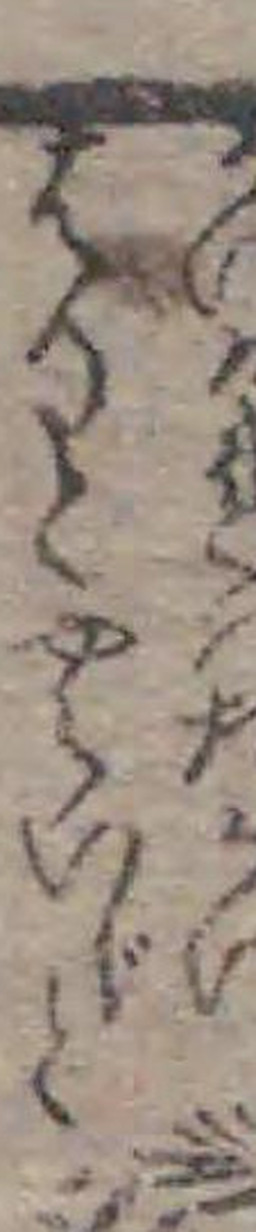はりとやらいじと
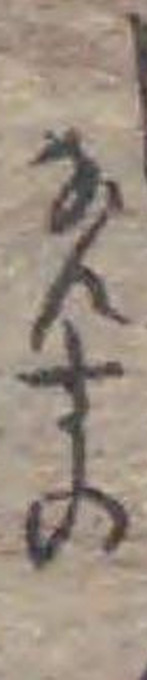なんすの
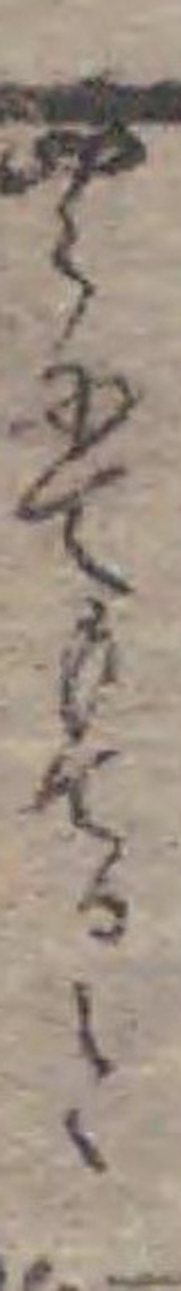やらにてもてると
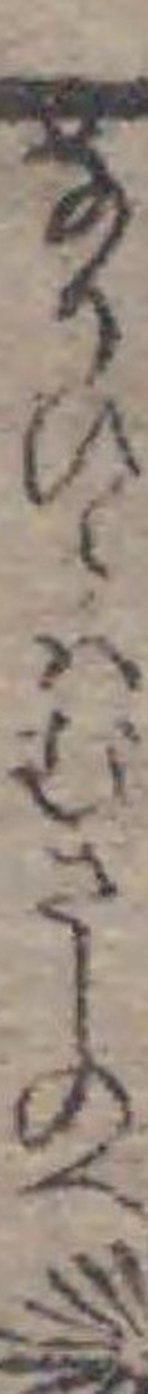なりひらはむさしのへ
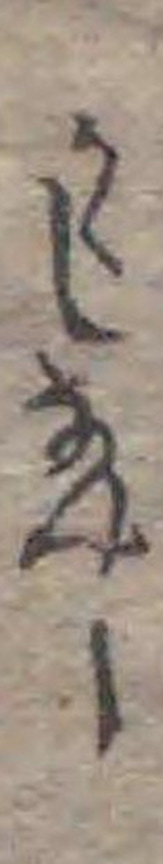かくしなんし
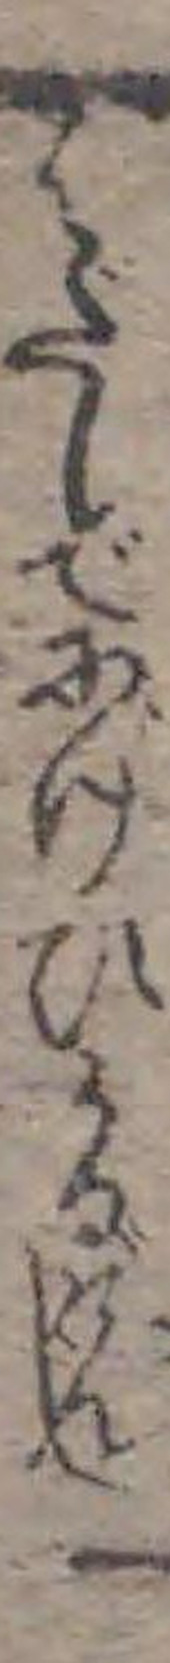はだしでにげひかるげんし
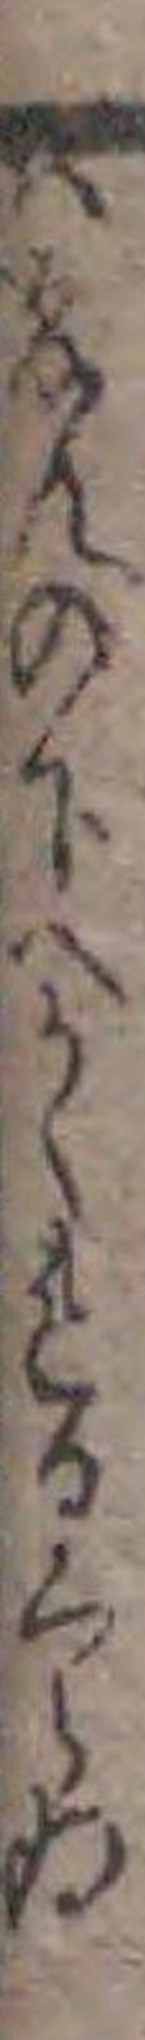はゑんの下へかくれるくらゐ
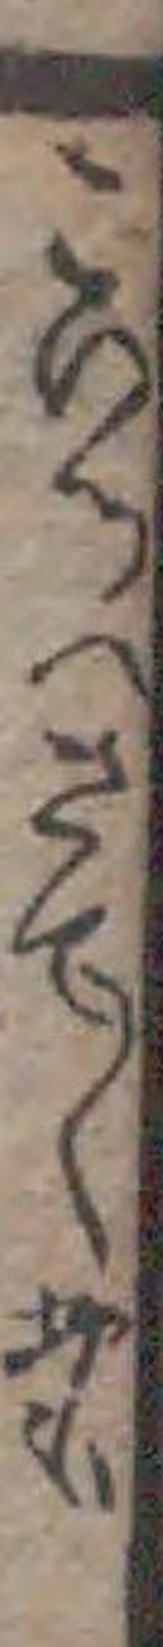こいつはさて〳〵おも
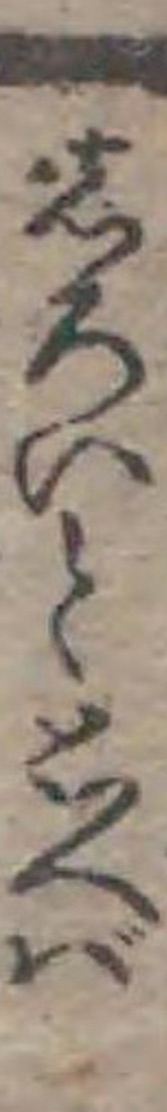しろいと思へば
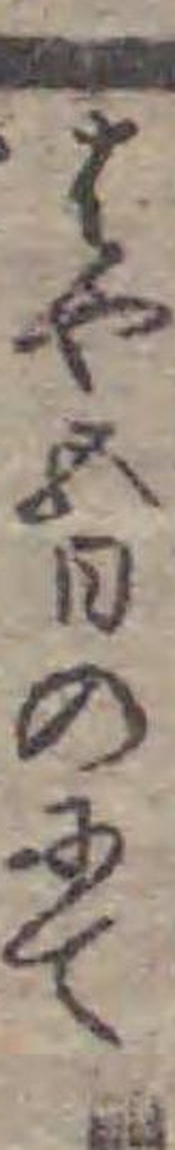はや五日のにて
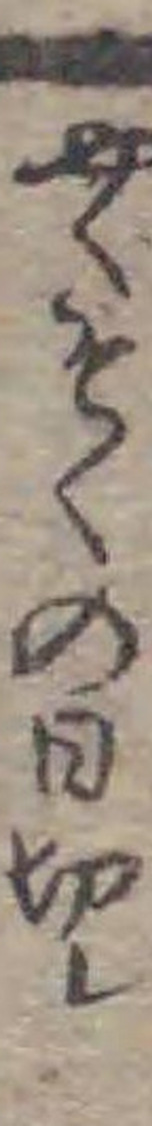やくそくの日切れ
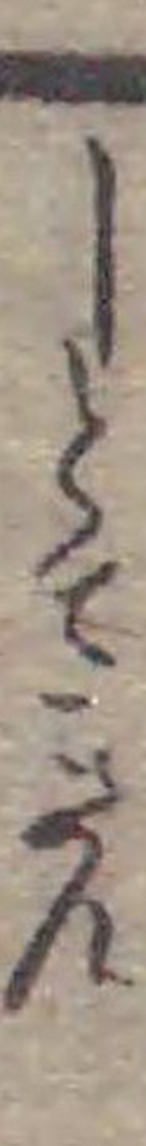しとてきん
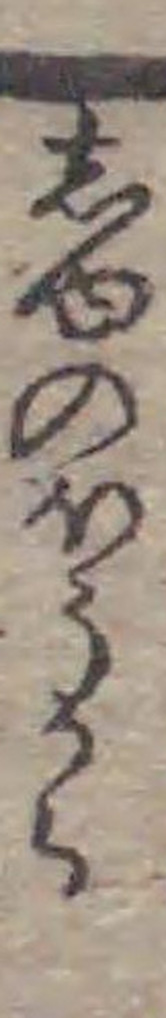しゆのほうから
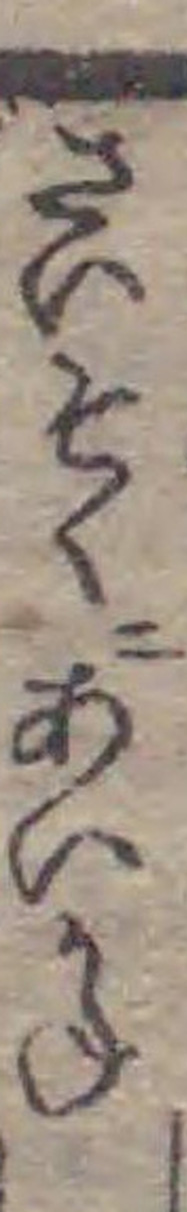さいそくにあいかね
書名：紺屋百物語 : 3巻
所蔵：国立国会図書館 National Diet Library, JAPAN
